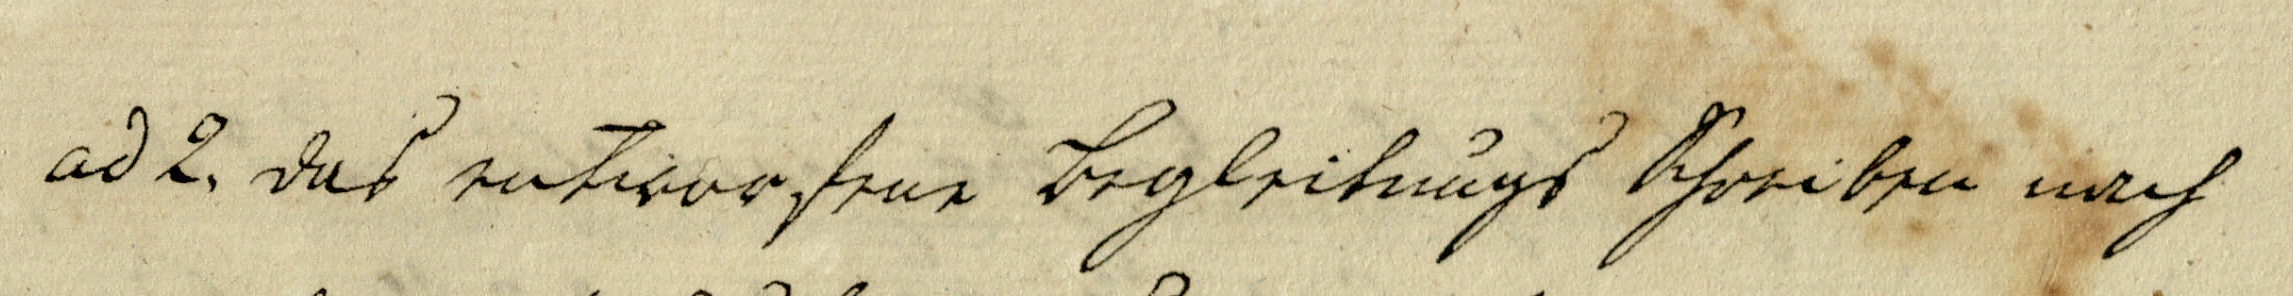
ad 2. das entworfene Begleitungs Schreiben nach
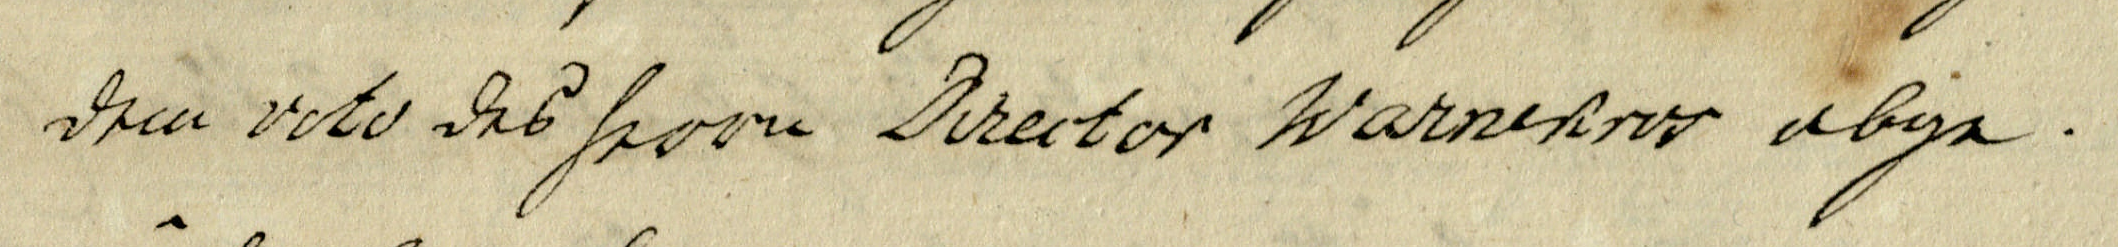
dem voto des Herrn Director Warnekros abge¬
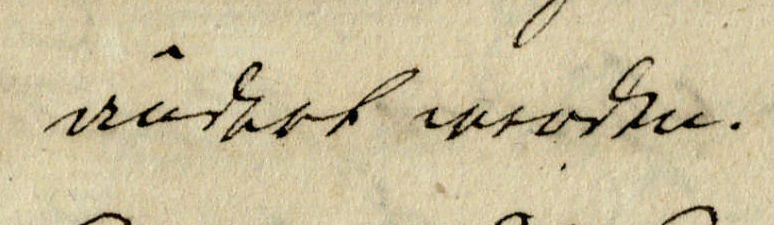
ändert werden.
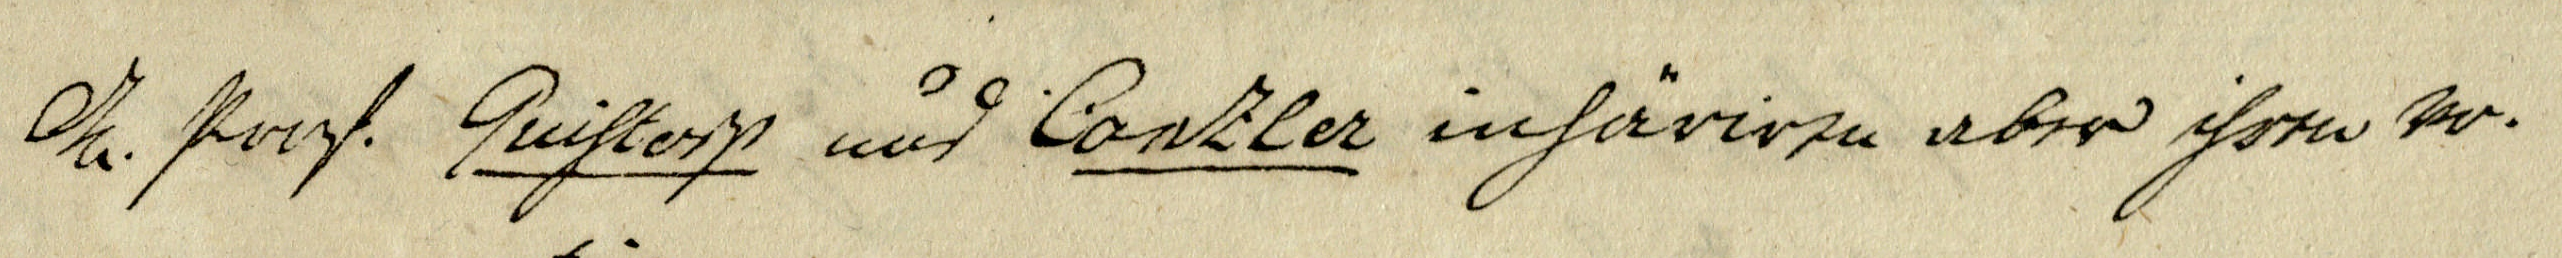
dh. Prof. Quistorp und Canzler inhäriren aber ihren vo¬
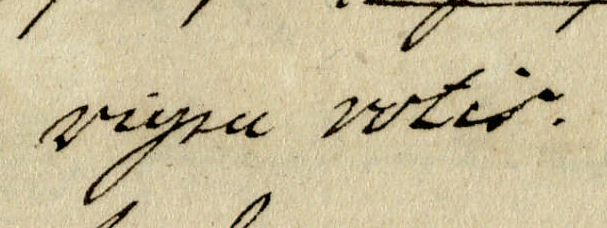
rigen votis.
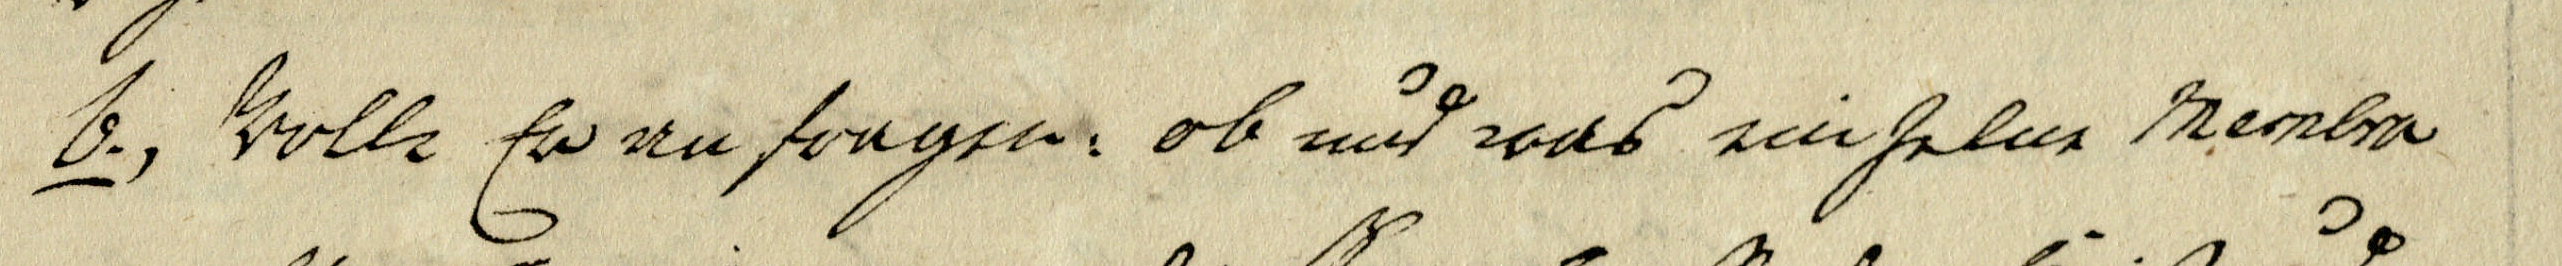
b., Wolle Er anfragen: ob und was einzelne Membra
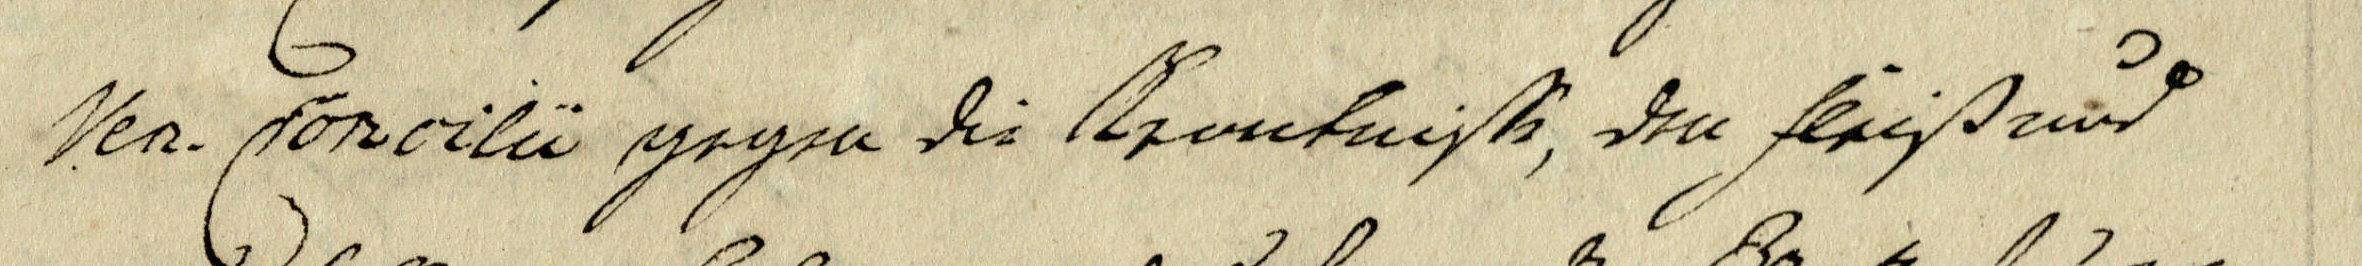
Ven. Concilii gegen die Kenntnisse, den Fleiß und
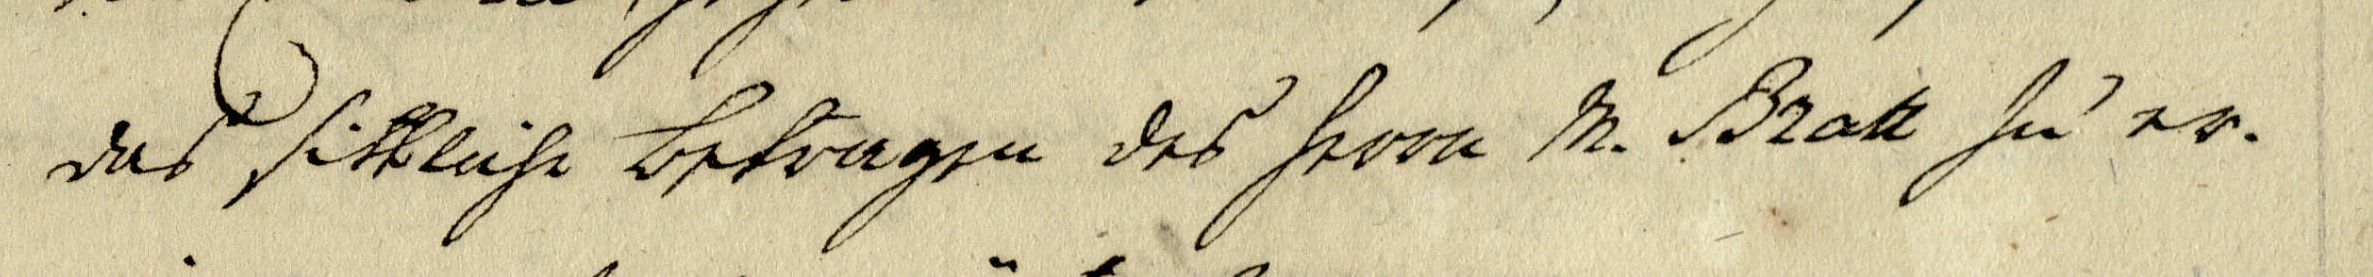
das sittliche Betragen des Herrn M. Bratt zu er¬
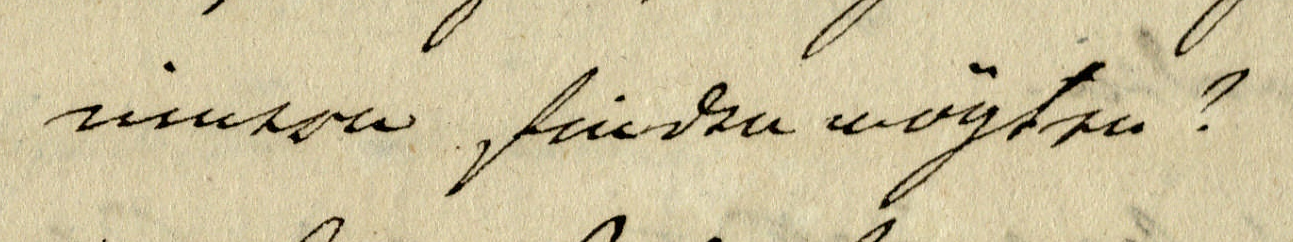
innern finden mögten?
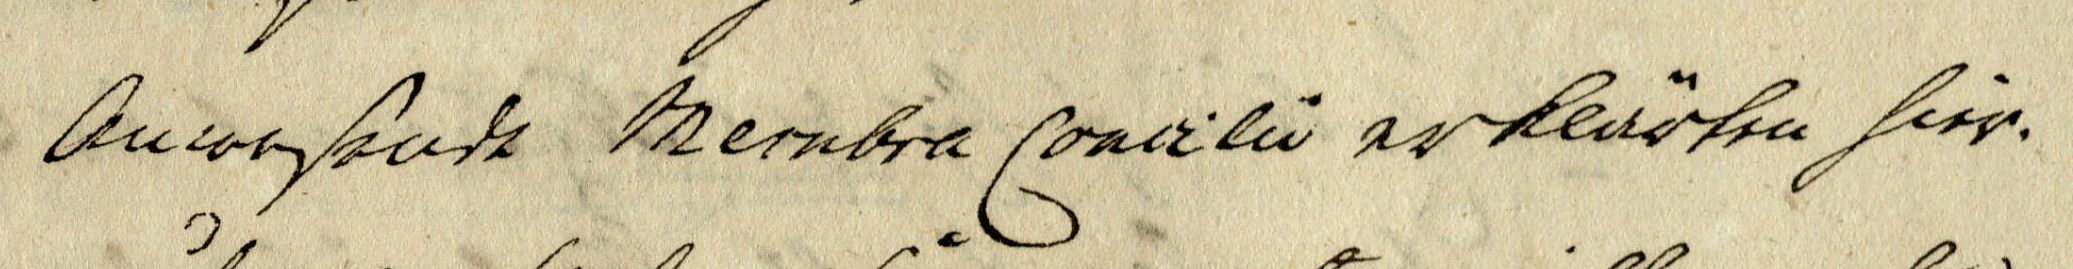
Anwesende Membra Concilii erklärten hier¬
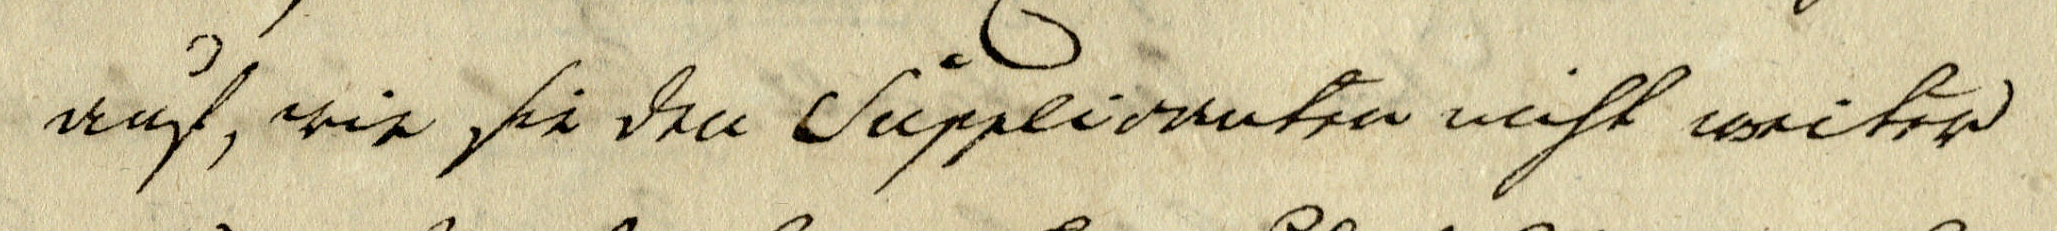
auf, wie sie den Supplicanten nicht weiter
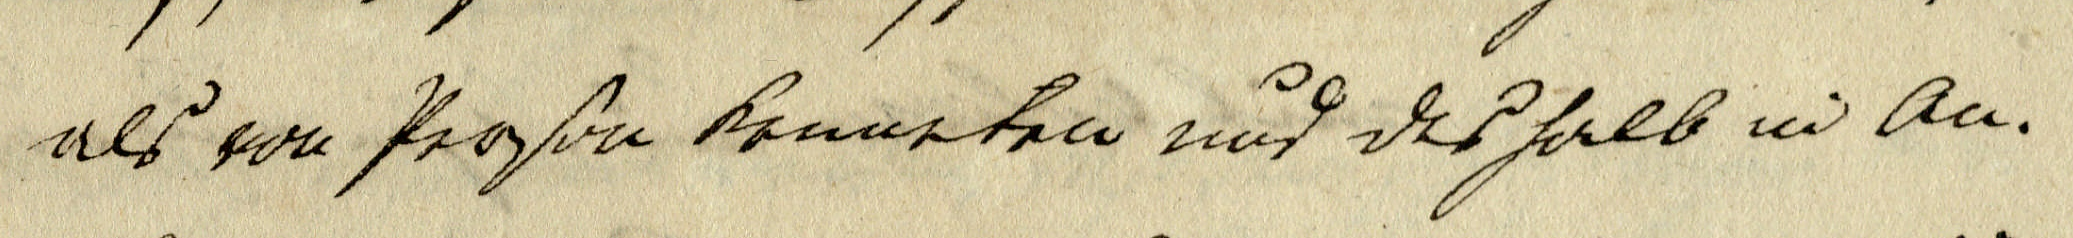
als von Person kenneten und deshalb in An¬
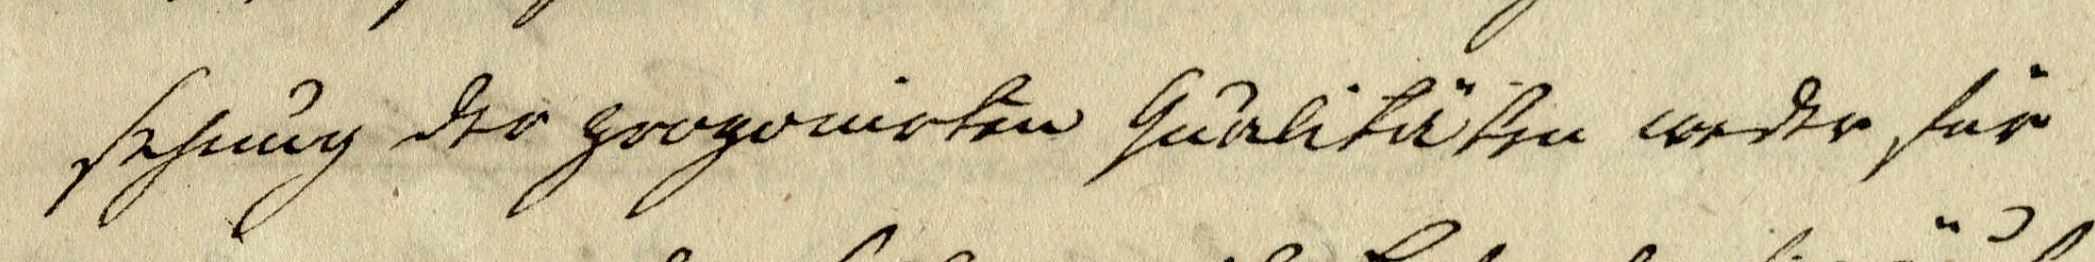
sehung der proponirten Qualitäten weder für
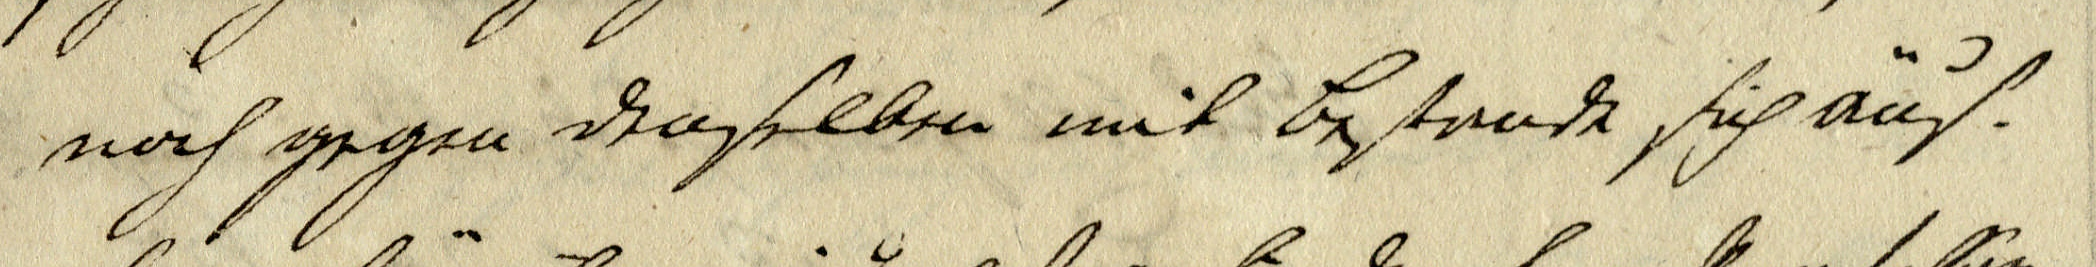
noch gegen denselben mit Bestande sich äus¬
